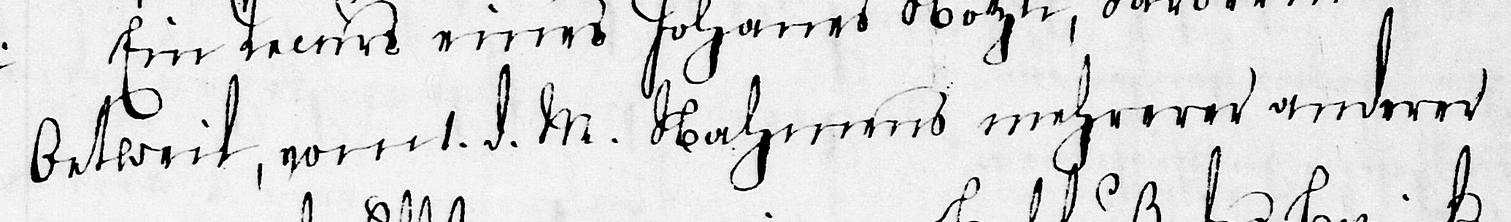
etweil, vom 1. d. M. Nahmens mehrerer anderer
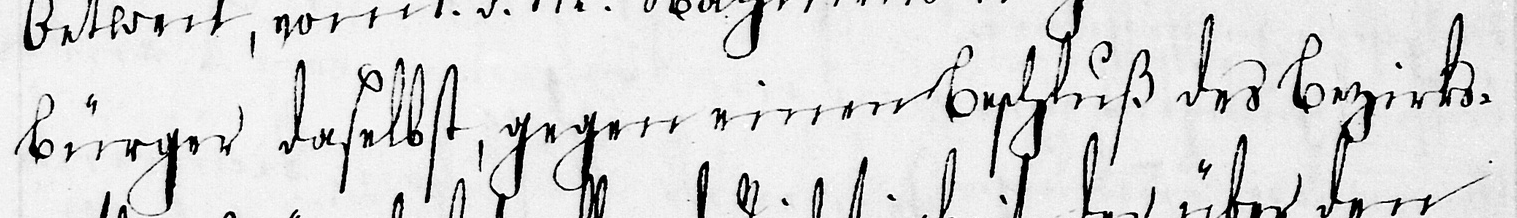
Bürger daselbst, gegen einen Beschluß des Bezirks¬
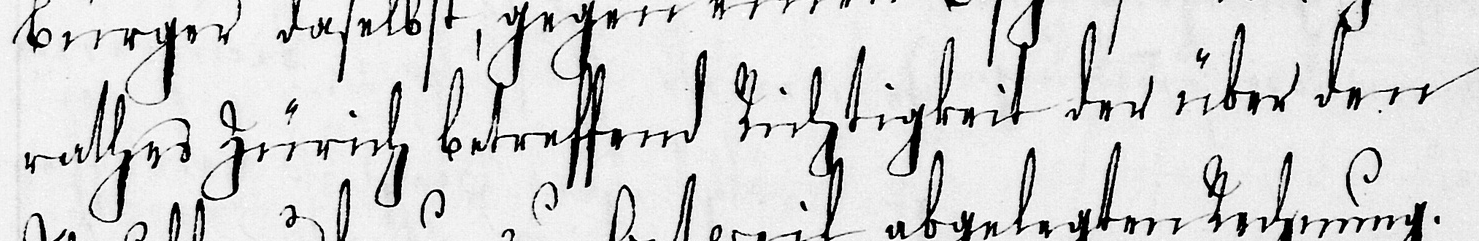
rathes Zürich betreffend Richtigkeit der über den
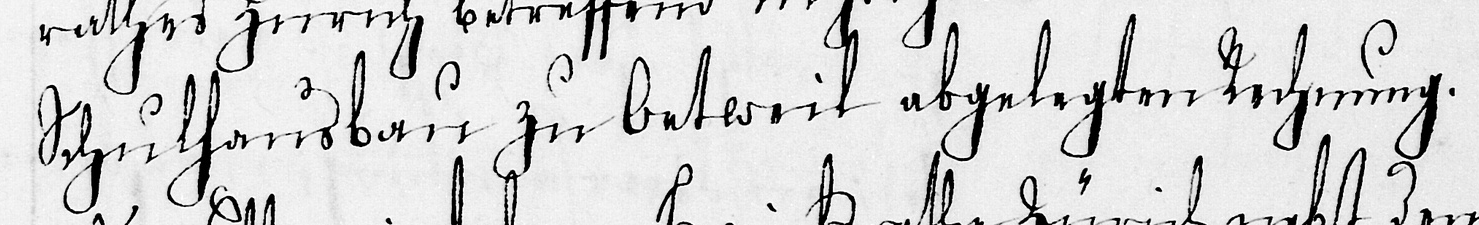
Schulhausbau zu Oetweil abgelegten Rechnung.
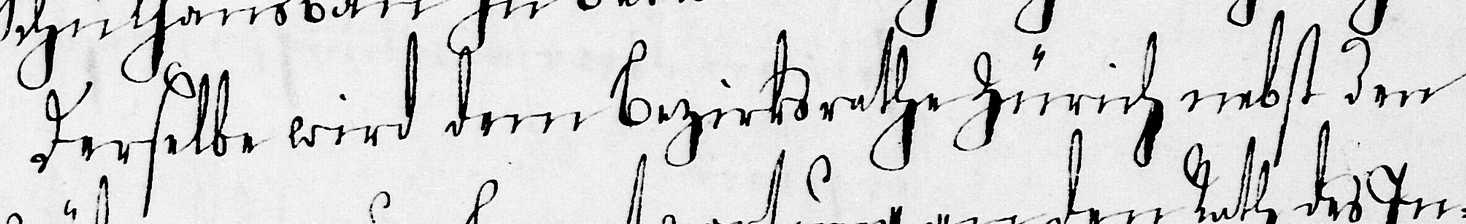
Derselbe wird dem Bezirksrathe Zürich nebst den
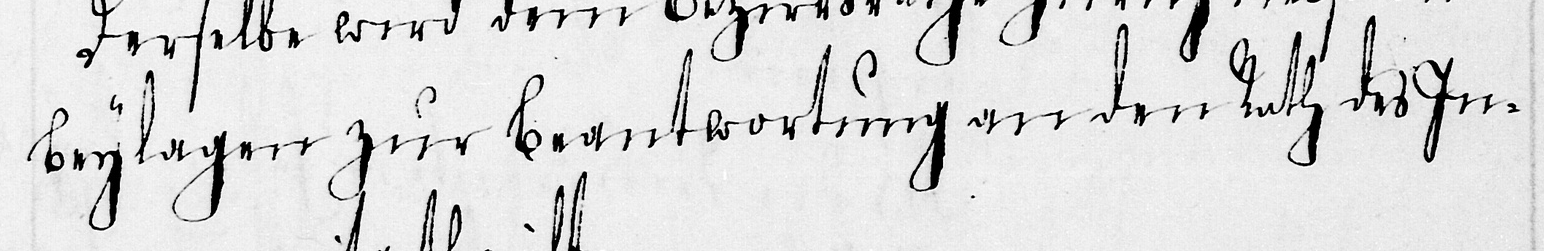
Beylagen zur Beantwortung an den Rath des In¬
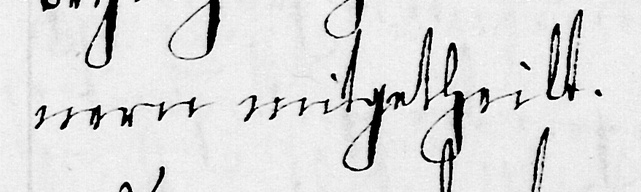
nern mitgetheilt.
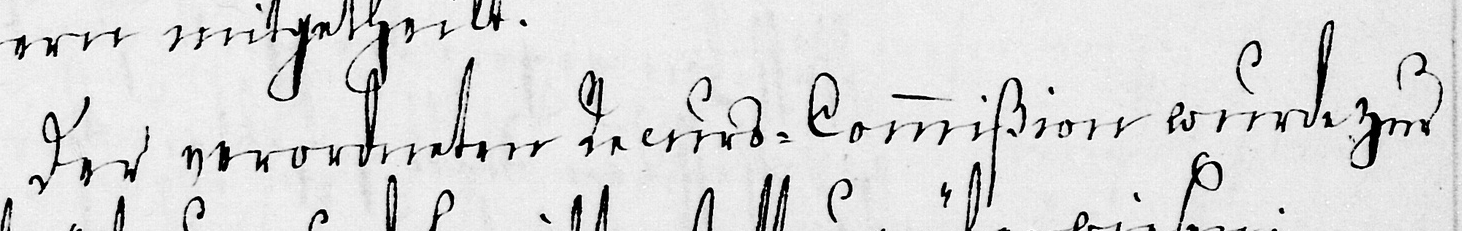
Der verordneten Recurs-Commißion wurde zur
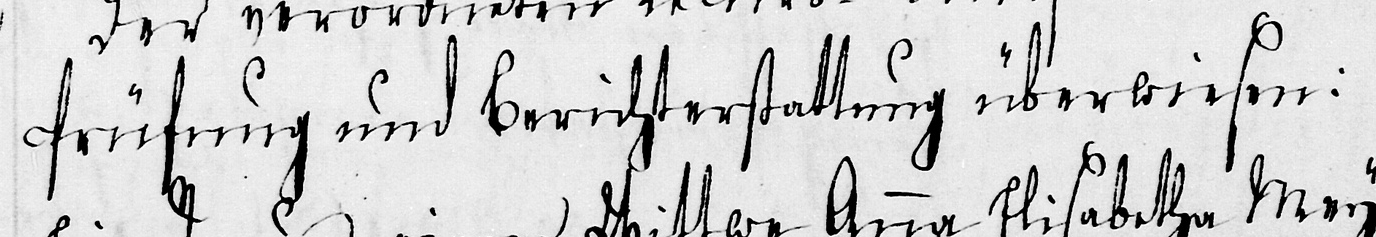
Prüfung und Berichterstattung überwiesen:
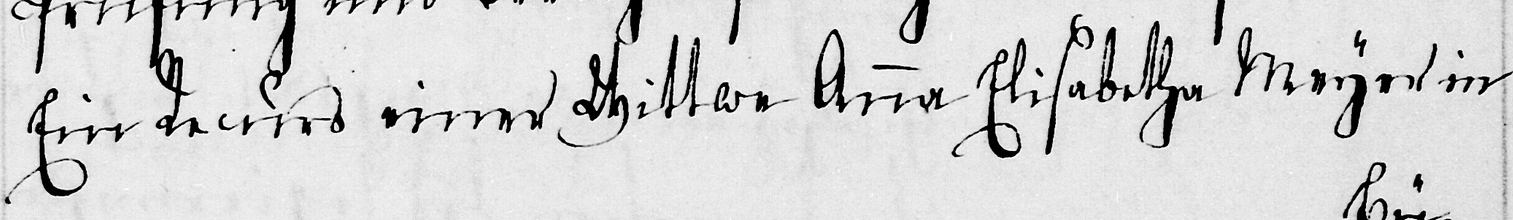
Ein Recurs einer Wittwe Anna Elisabetha Meyer in
